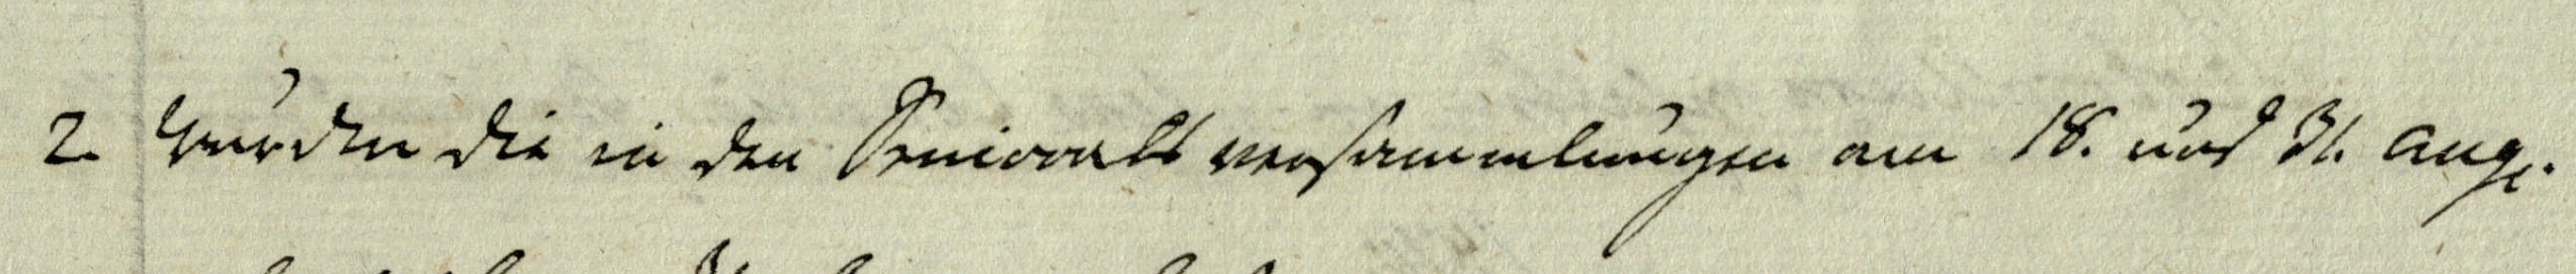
2. Wurden die in den Senioratsversammlungen am 18. und 31. Aug.
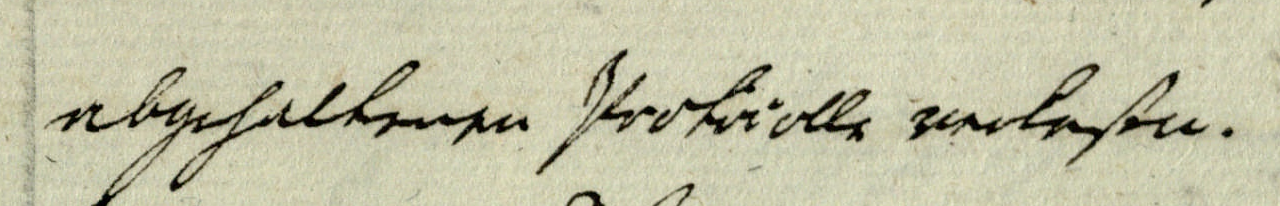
abgehaltenen Protocolle verlesen.
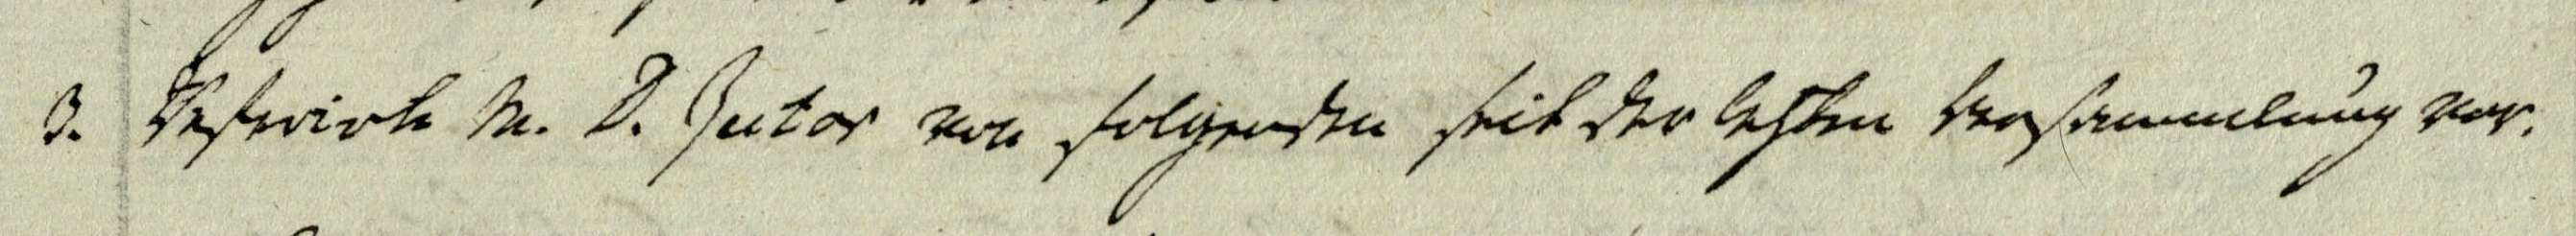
3. Referirte M. D. Rector von folgenden seit der letzten Versammlung vor¬
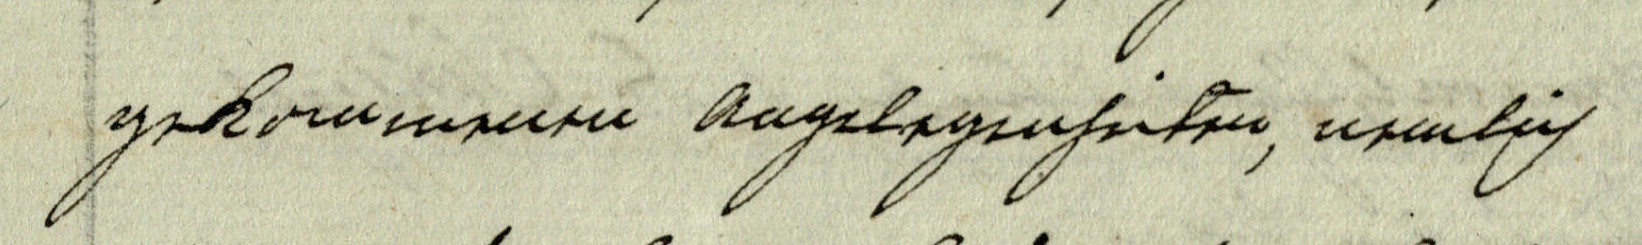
gekommenen Angelegenheiten, nemlich
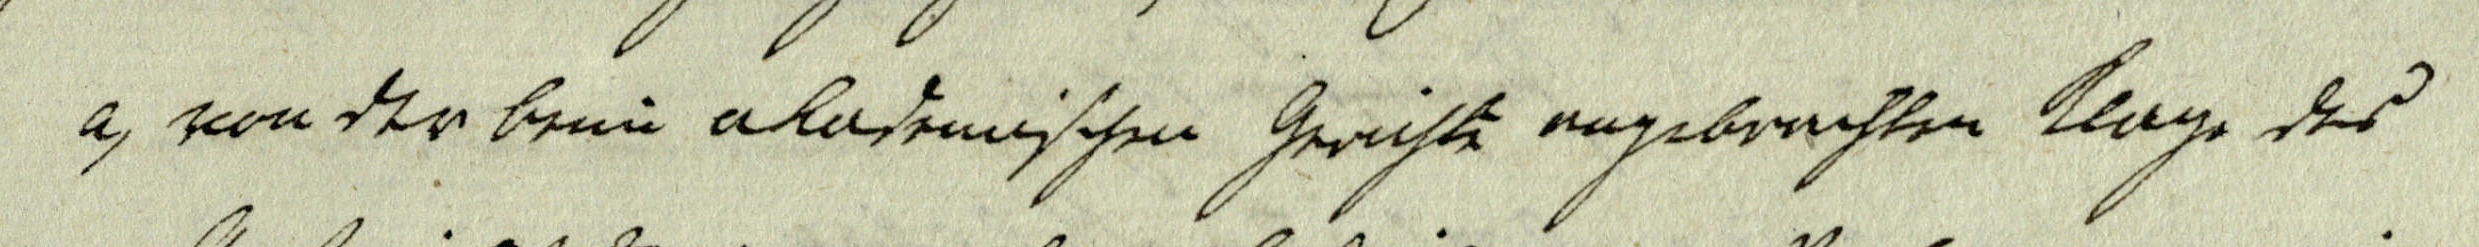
a, von der beim akademischen Gerichte angebrachten Klage des
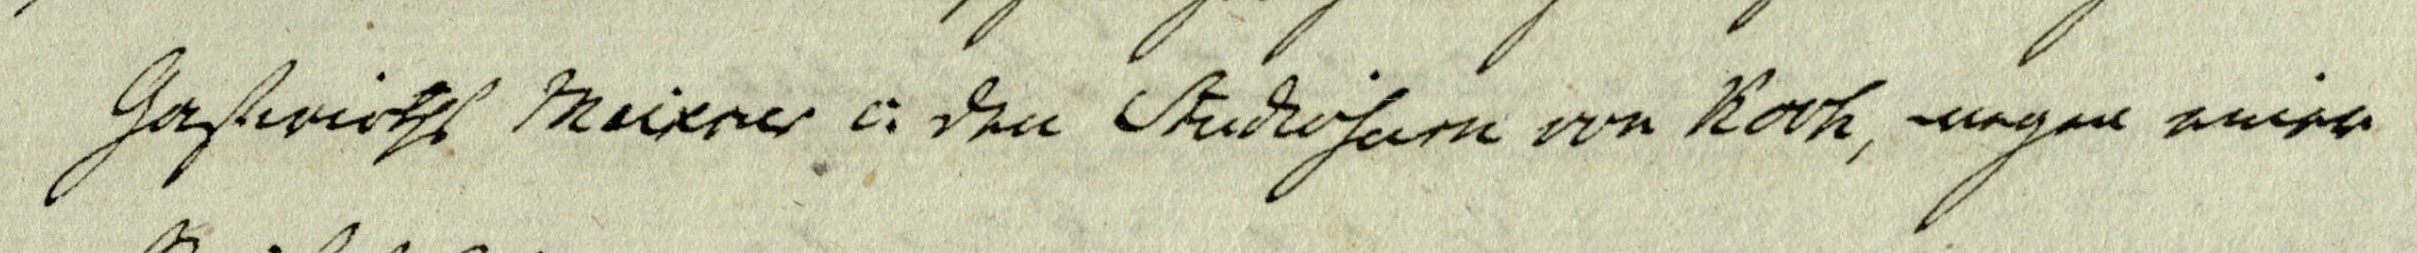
Gastwirths Meixner c. den Studiosum von Koch, wegen einer
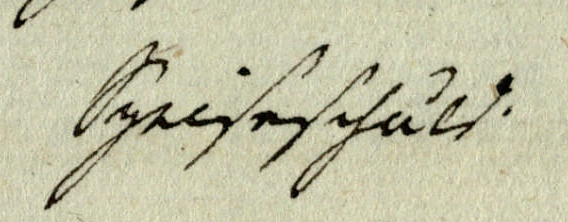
Speiseschuld.
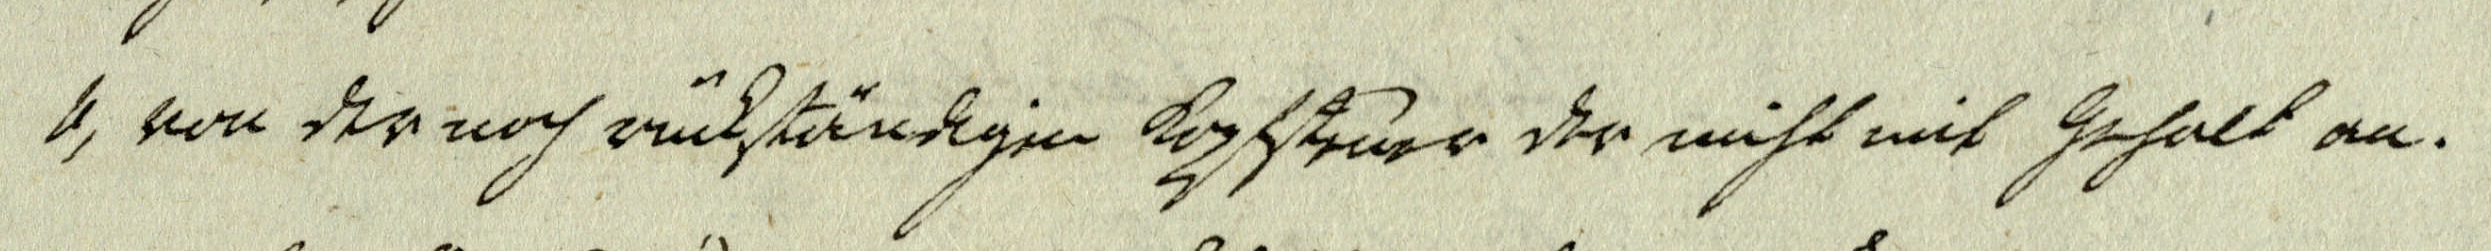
b, von der noch rückständigen Kopfsteuer der nicht mit Gehalt an¬
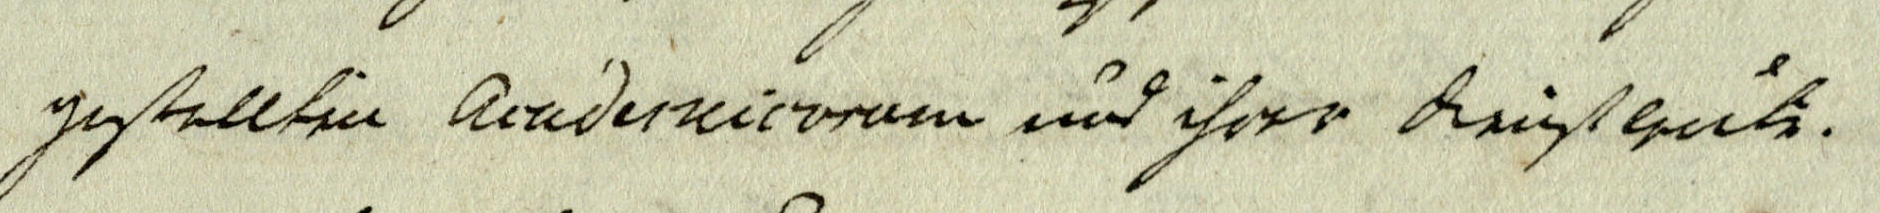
gestellten Academicorum und ihrer Dienstleute.
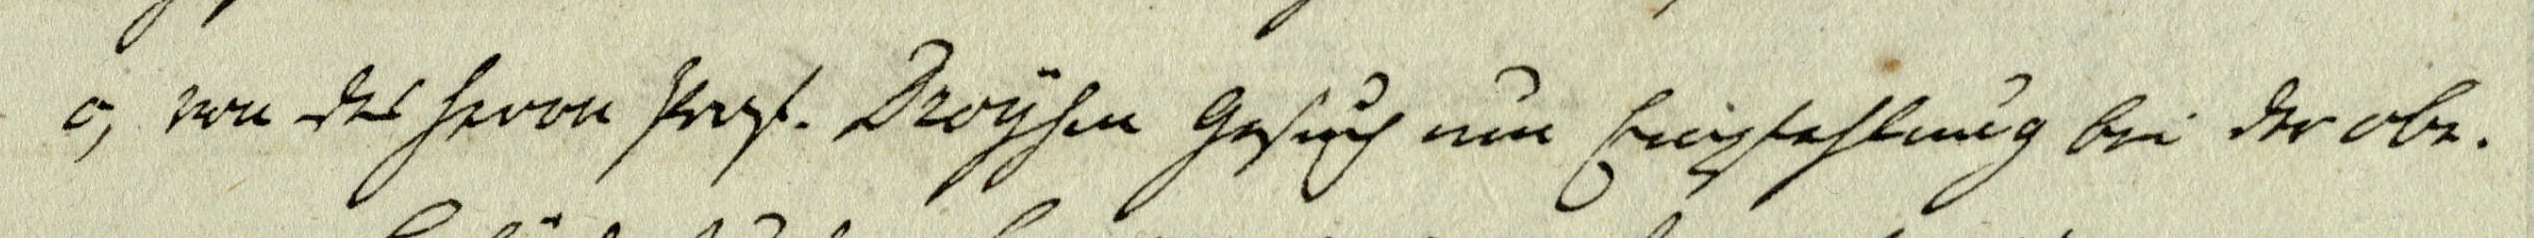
c, von des Herrn Prof. Droÿsen Gesuch um Empfehlung bei der obe¬
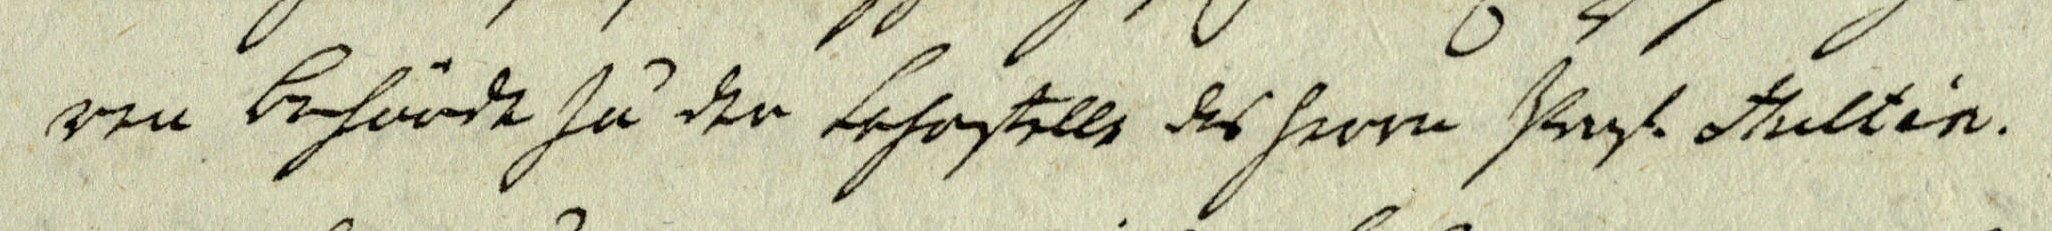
ren Behörde zu der Lehrstelle des Herrn Prof. Hultén.
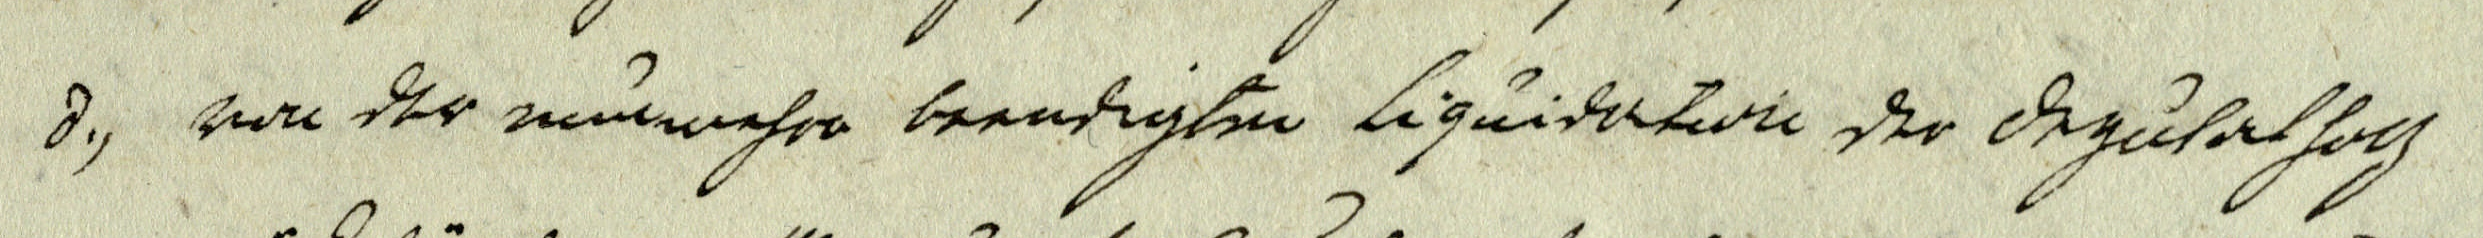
d., von der nunmehro beendigten Liquidation der Deputatholz
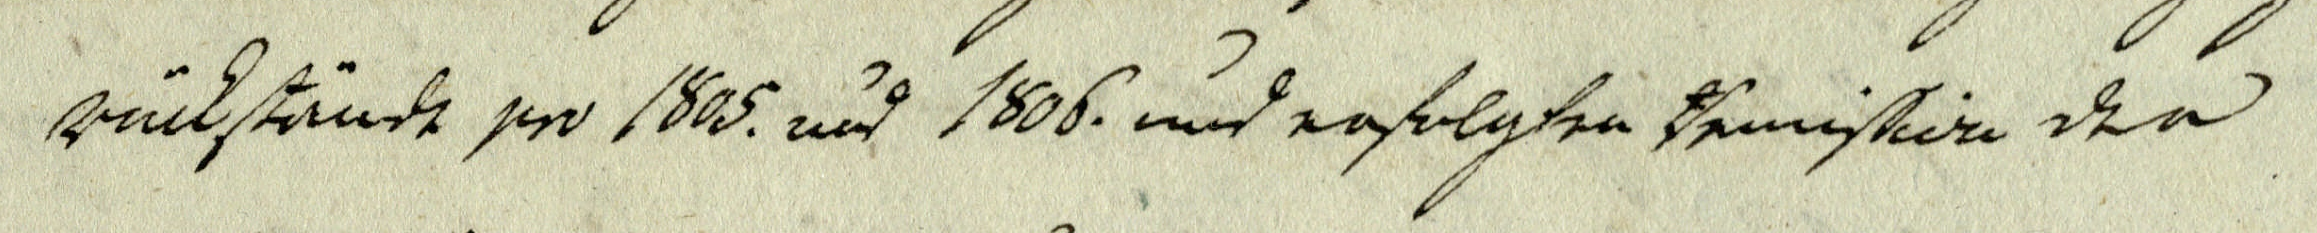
rückstände pro 1805. und 1806. und erfolgten Remission der
